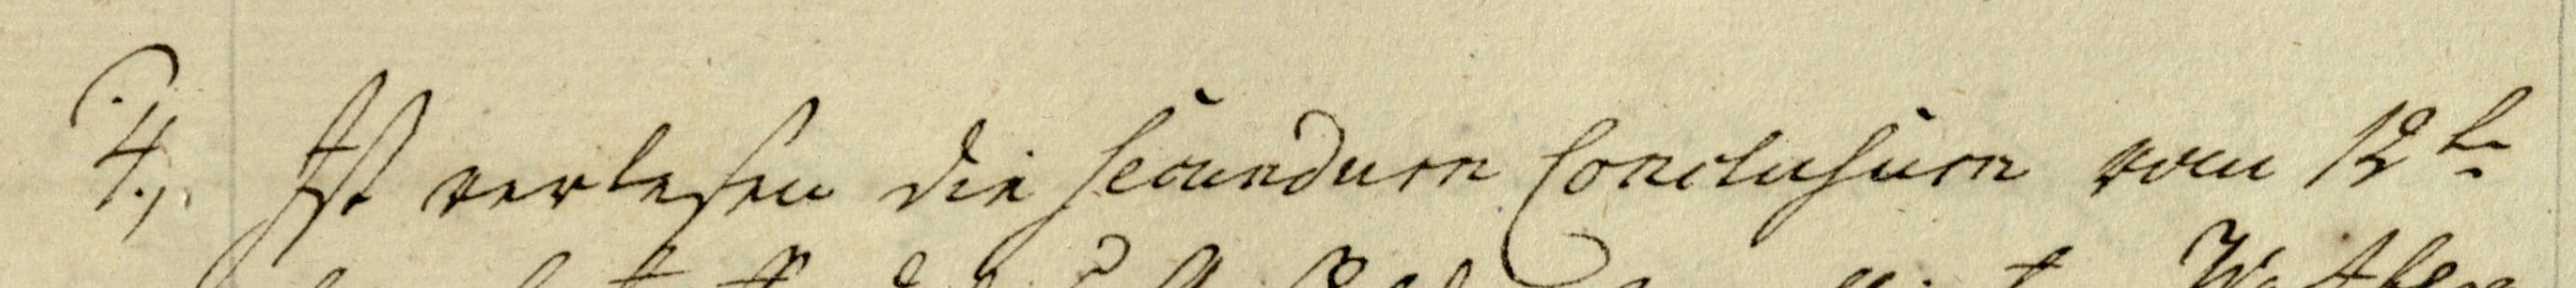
4., Ist verlesen die secundum Conclusum vom 12 t.
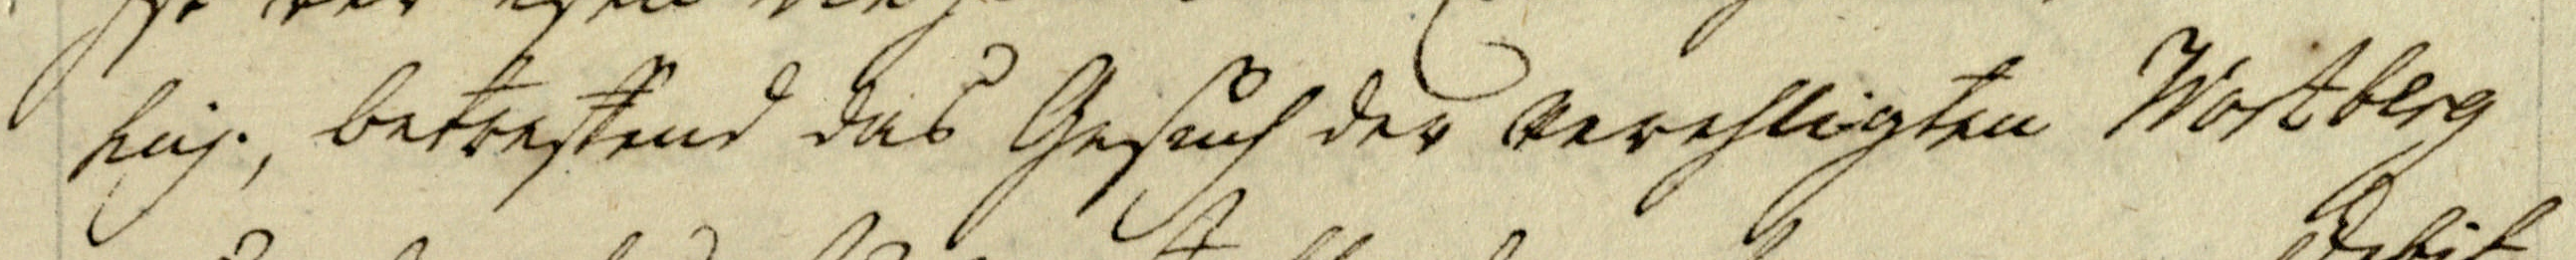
huj., betreffend das Gesuch der verehligten Wortberg
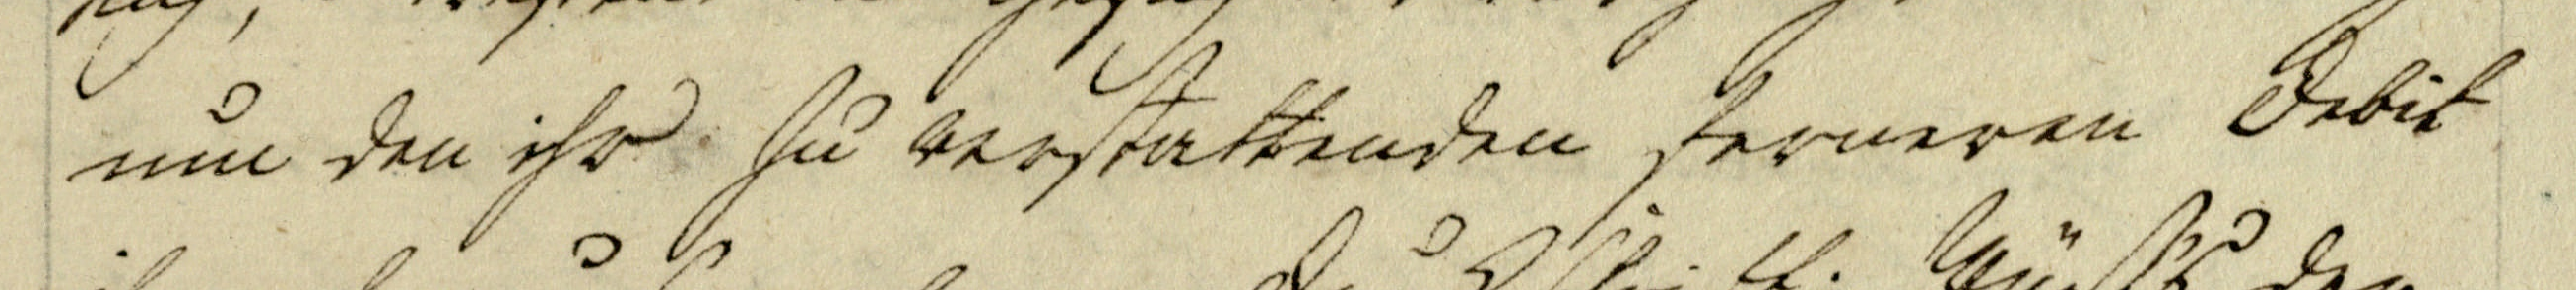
um den ihr zu verstattenden ferneren Debit
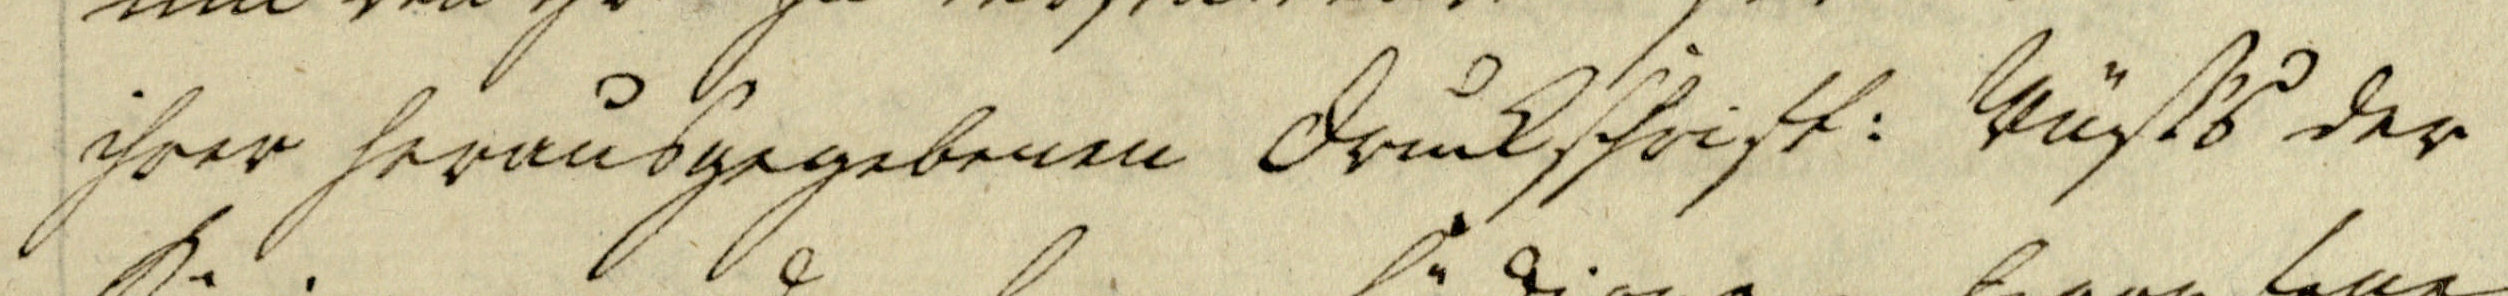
ihrer herausgegebenen Druckschrift: Wüßts der
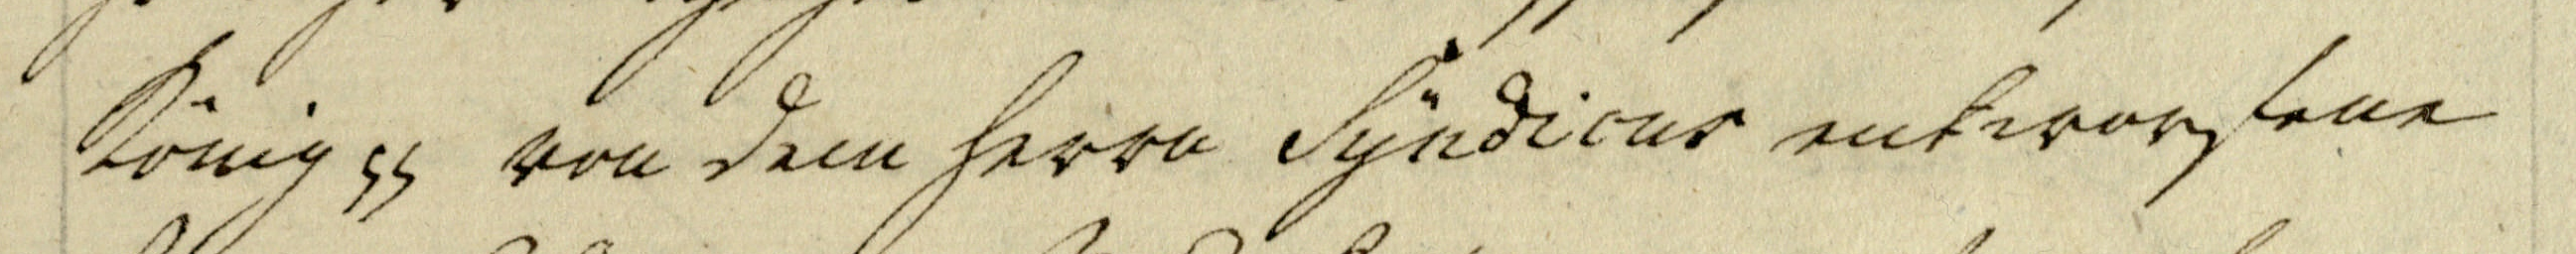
König , von dem Herrn Sÿndicus entworfene
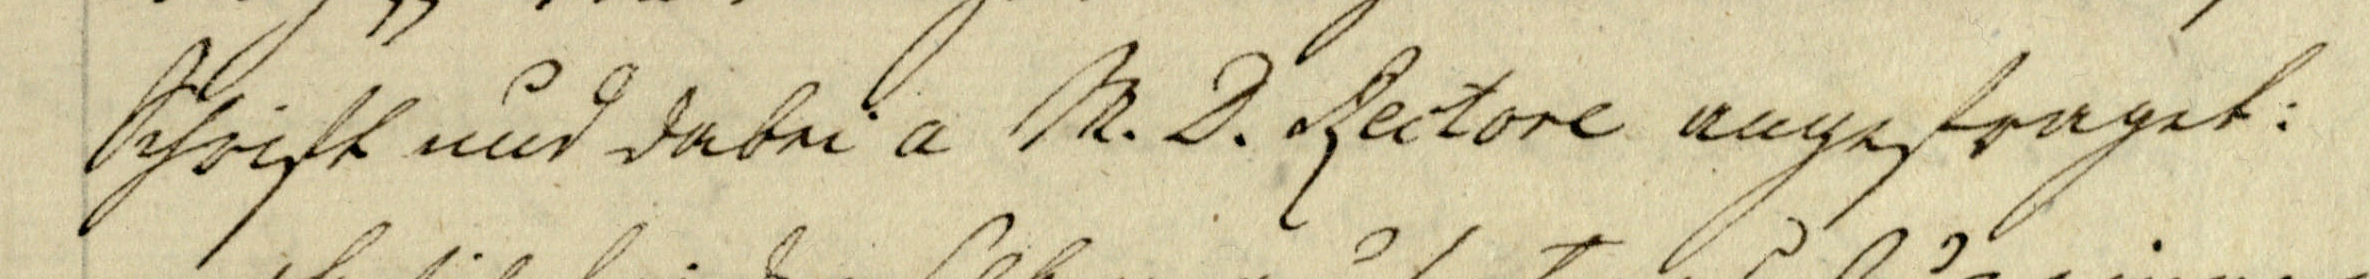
Schrift und dabei a M. D. Rectore angefraget:
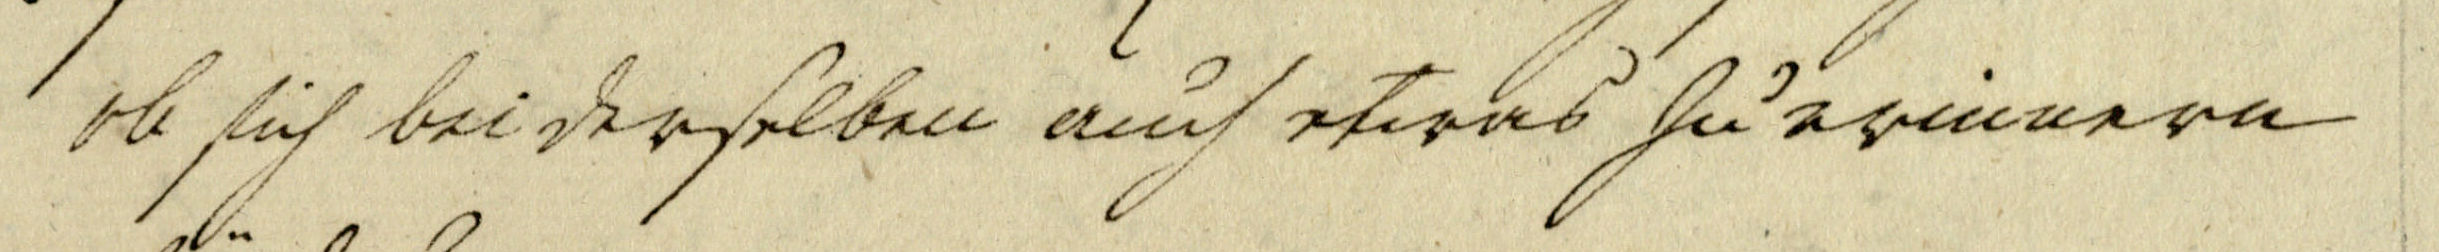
ob sich bei derselben auch etwas zu erinnern
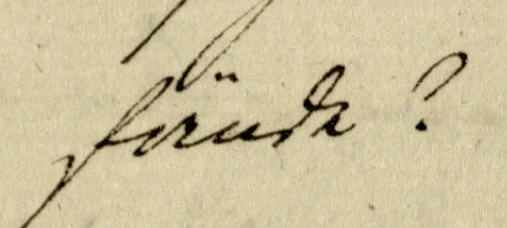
fände?
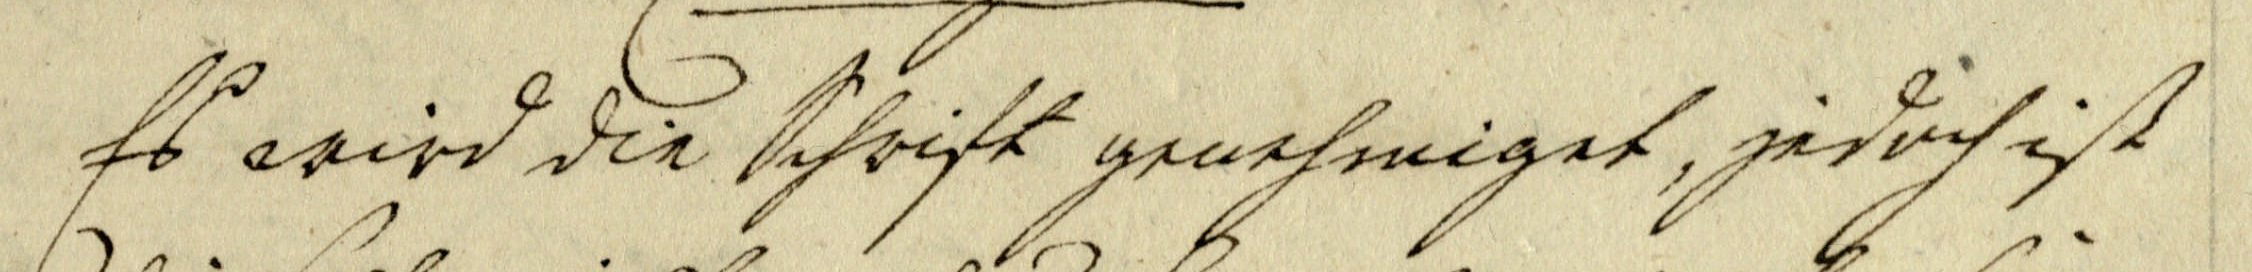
Es wird die Schrift genehmiget, jedoch ist
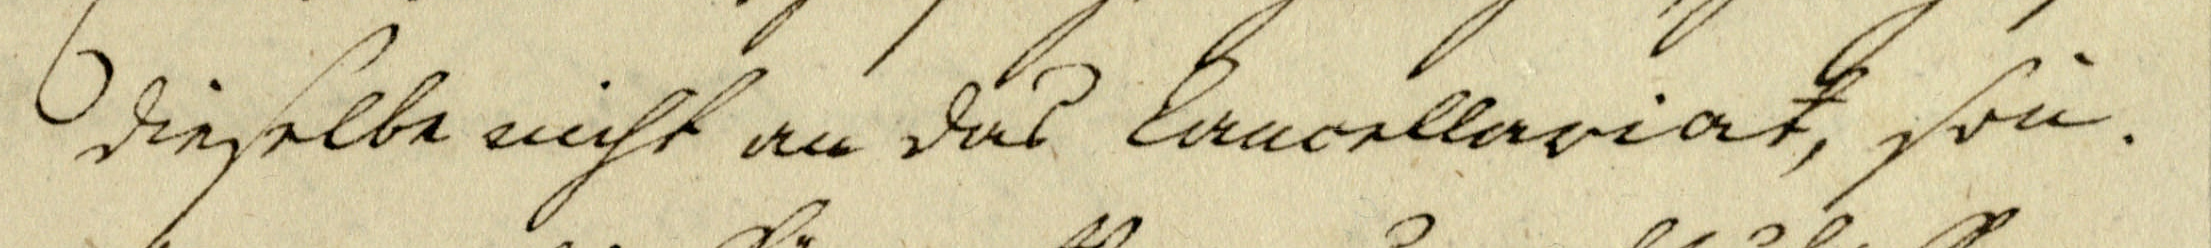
dieselbe nicht an das Cancellariat, son¬
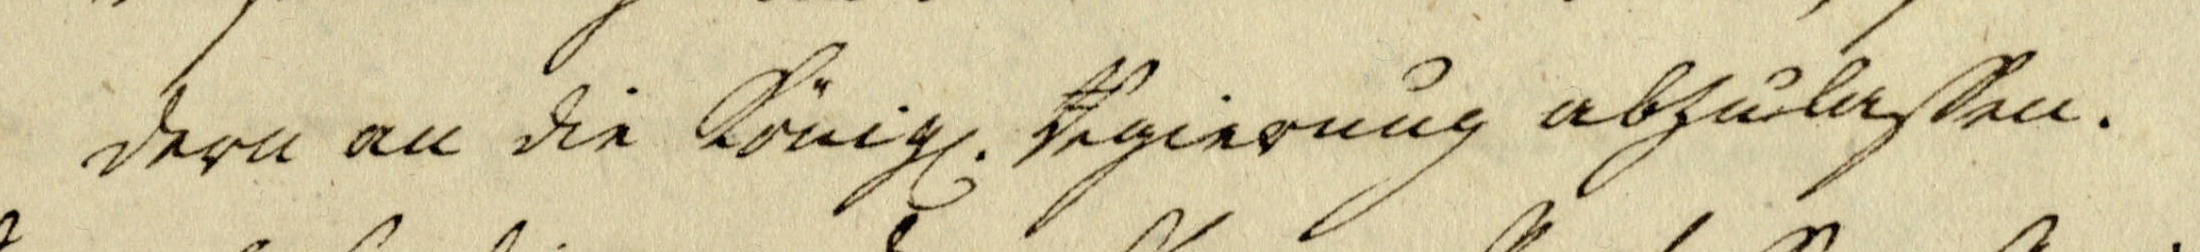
dern an die Königl. Regierung abzulassen.
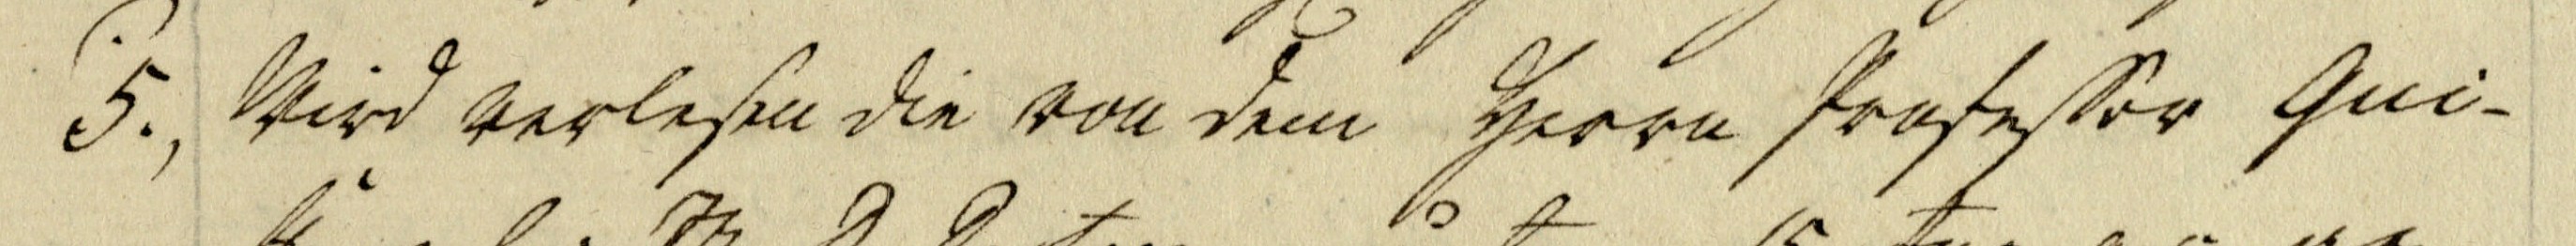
5., Wird verlesen die von dem Herrn Professor Qui¬
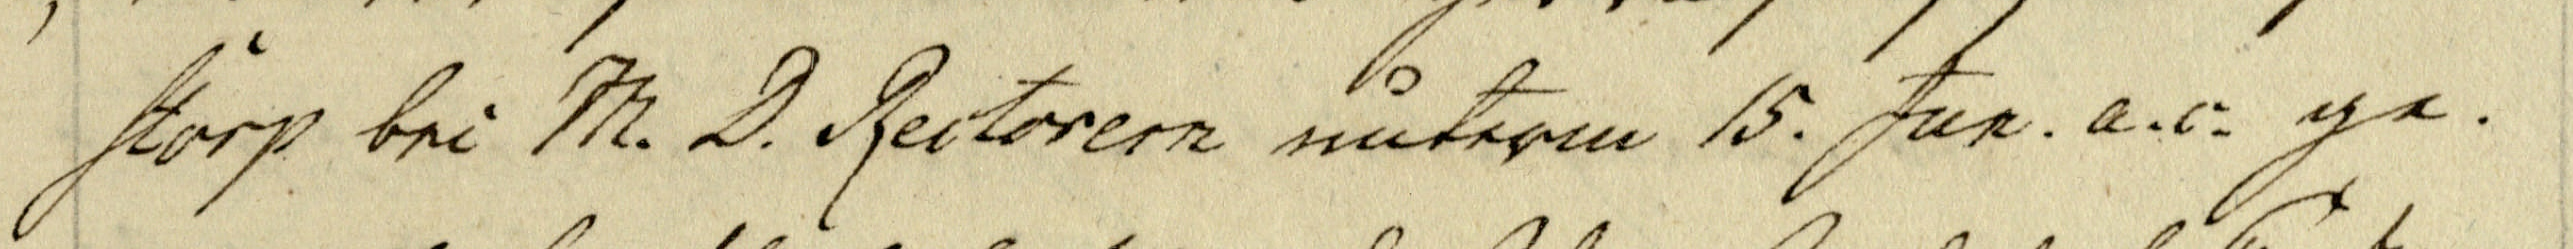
storp bei M. D. Rectorem unterm 15. Jun. a. c. ge¬
